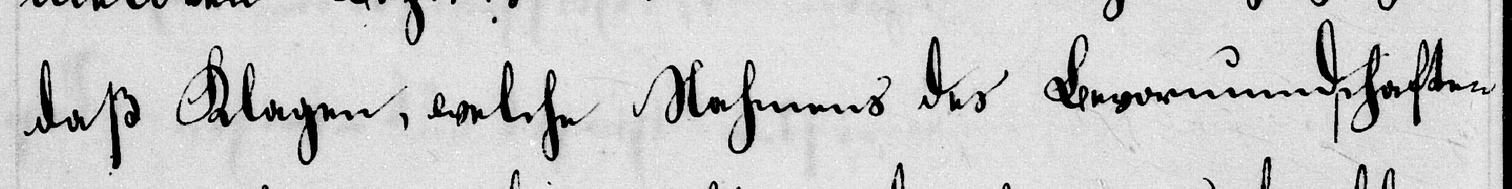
daß Klagen, welche Nahmens des Bevormundschafte¬
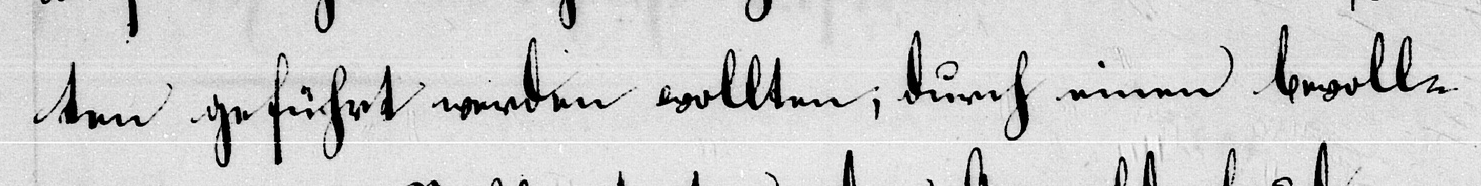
ten geführt werden wollten, durch einen bevoll¬
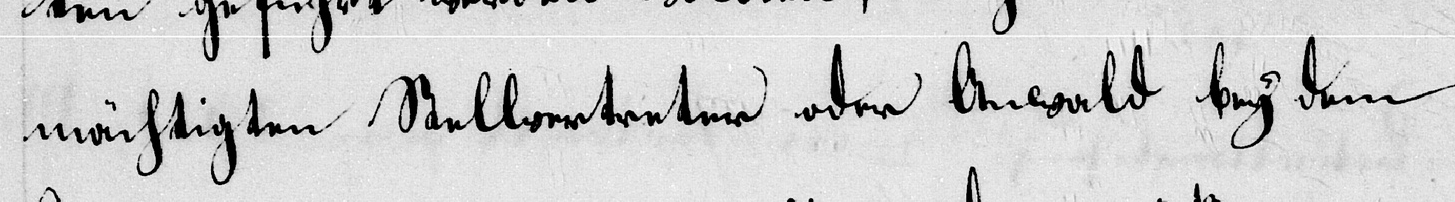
mächtigten Stellvertreter oder Anwald bey dem
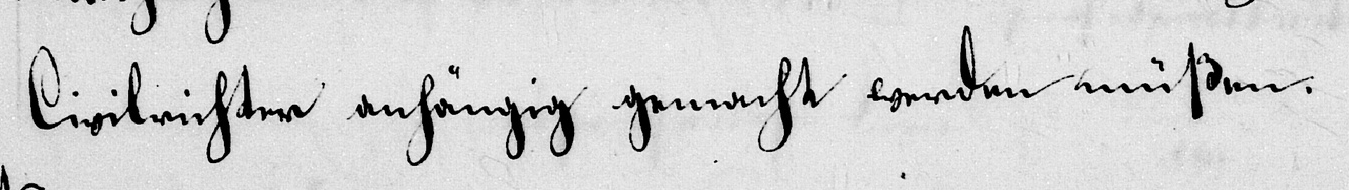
Civilrichter anhängig gemacht werden müßen.
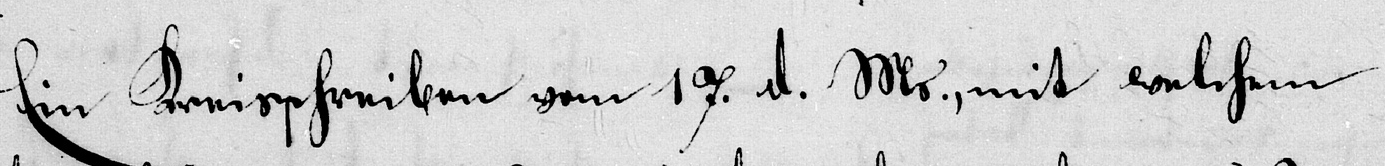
Ein Kreisschreiben vom 17. d. Ms., mit welchem
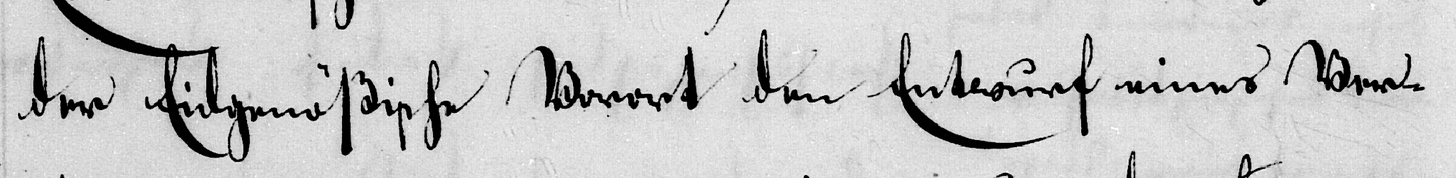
der Eidgenößische Vorort den Entwurf eines Ver¬
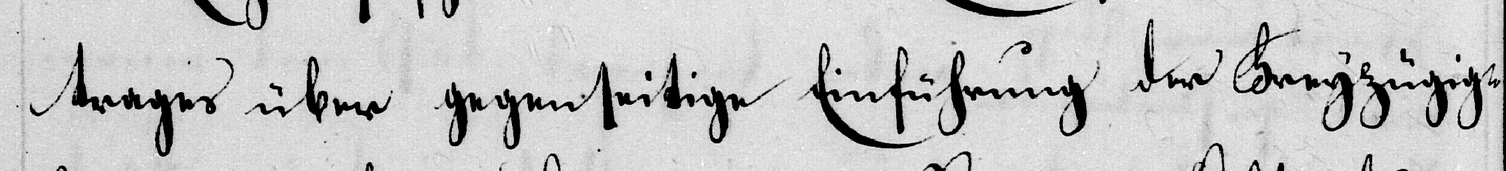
trages über gegenseitige Einführung der Freyzügig¬
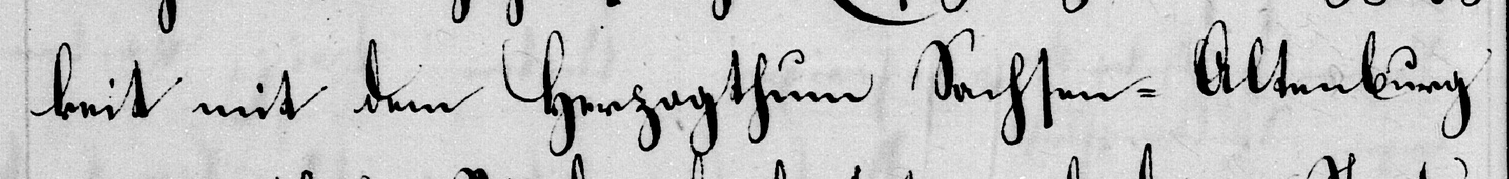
keit mit dem Herzogthum Sachsen-Altenburg
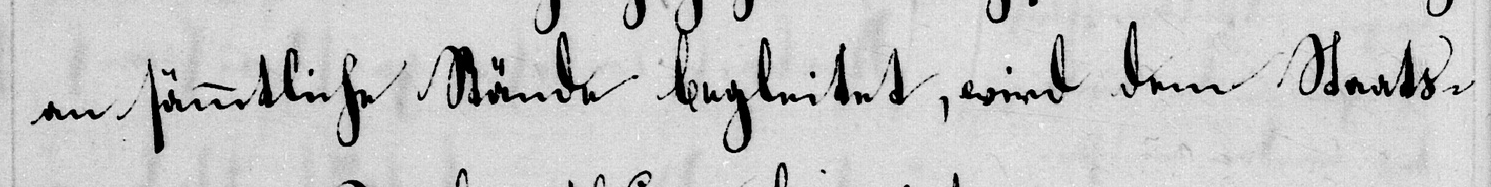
an sämmtliche Stände begleitet, wird dem Staats¬
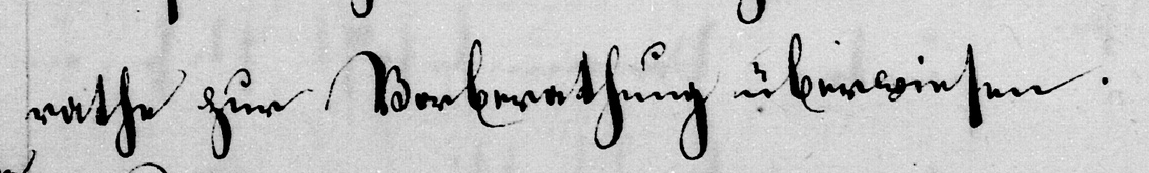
rathe zur Vorberathung überwiesen.
